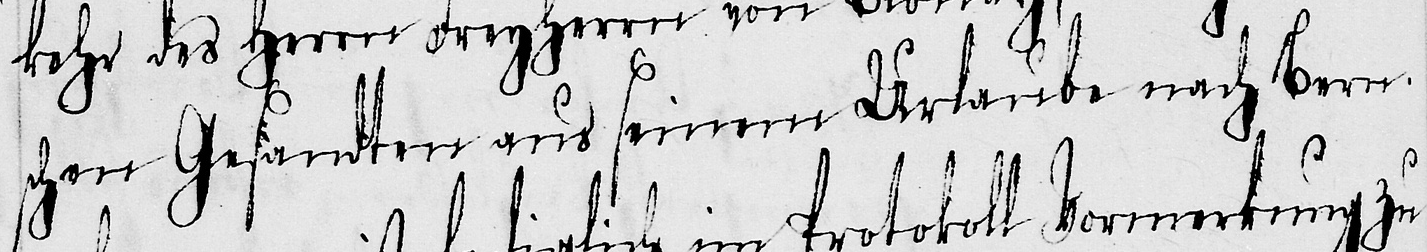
schen Gesandten aus seinem Urlaube nach Bern.
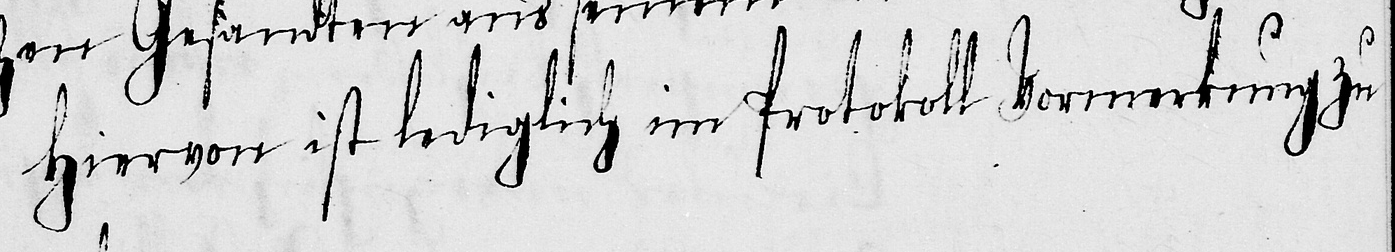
Hiervon ist lediglich im Protokoll Vormerkung zu
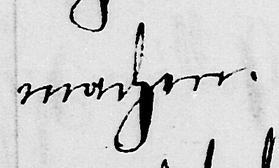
machen.
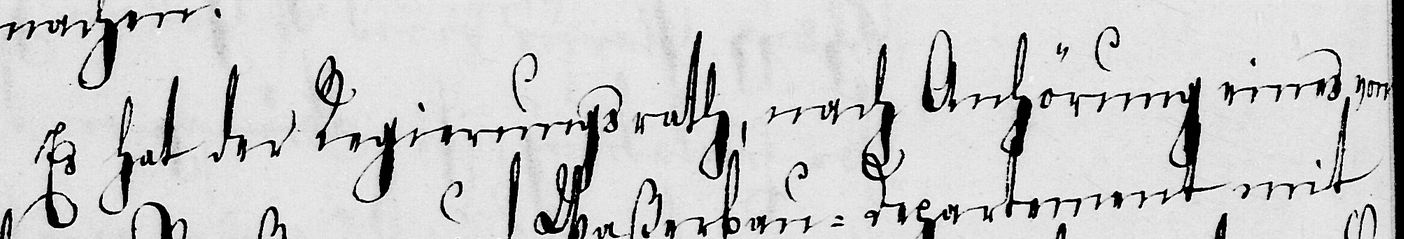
Es hat der Regierungsrath, nach Anhörung eines v¬
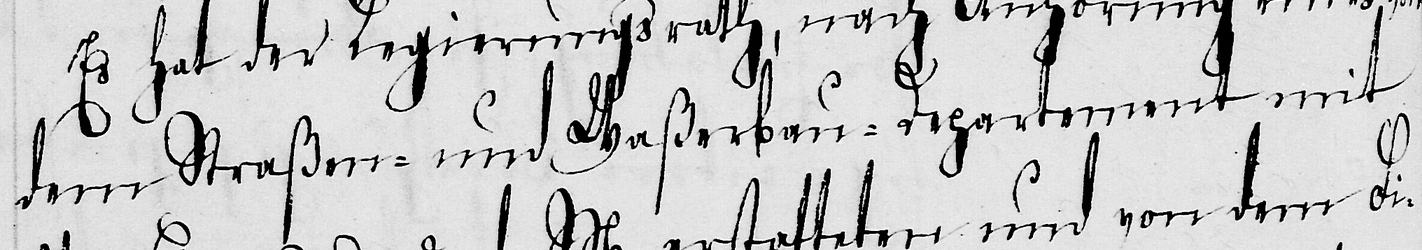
dem Straßen- und Waßerbau-Departement mit
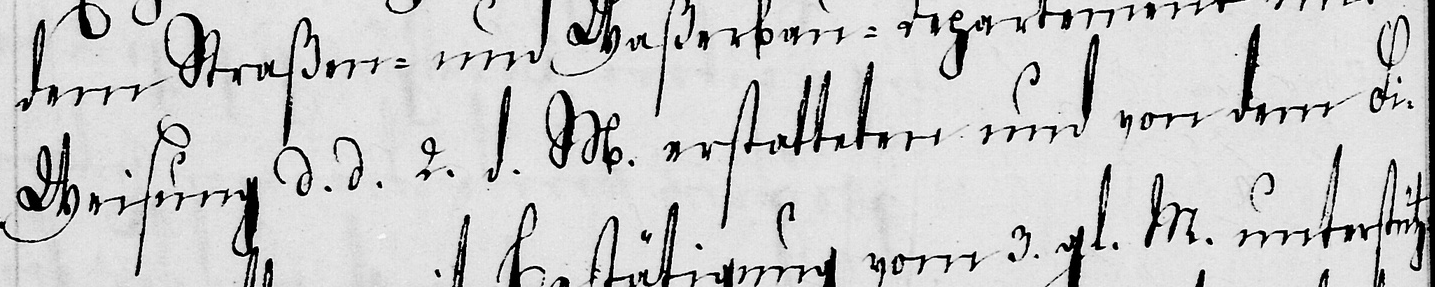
Weisung d. d. 2. d. M. erstatteten und von dem Fi¬
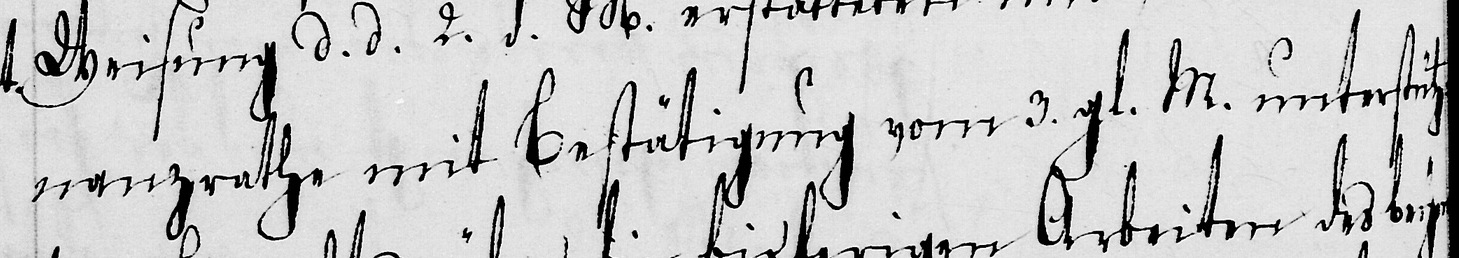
nanzrathe mit Bestätigung vom 3. gl. M. unterstü¬
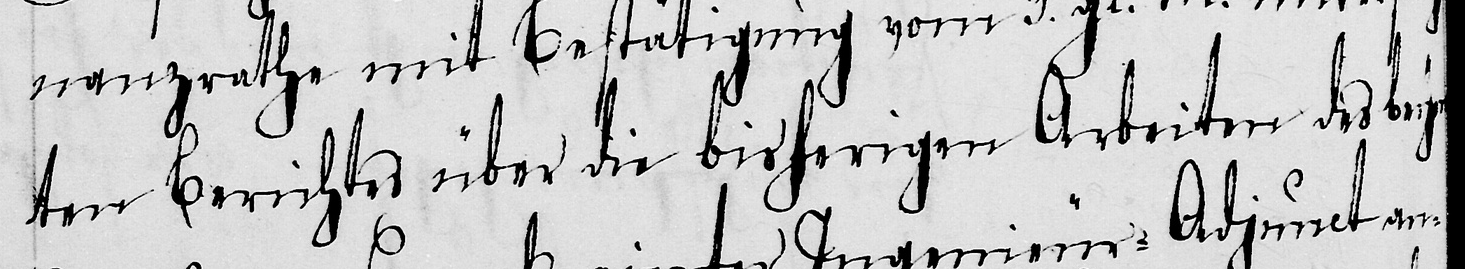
ten Berichtes über die bisherigen Arbeiten des beym
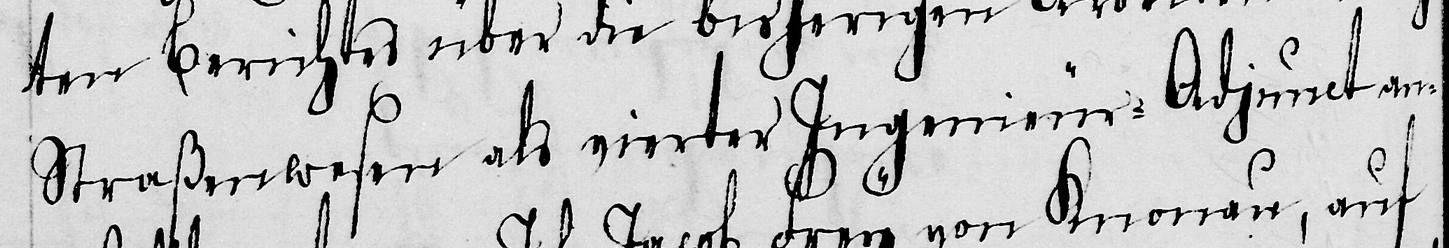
Straßenwesen als vierter Ingenieur-Adjunct an¬
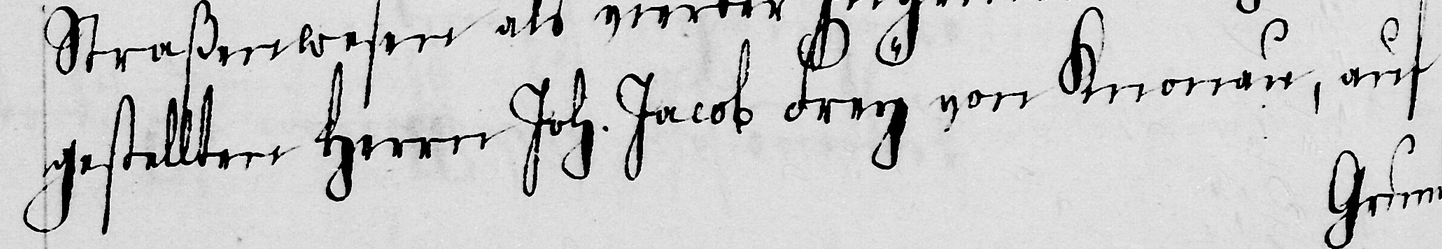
gestellten Herrn Joh. Jacob Frey von Knonau, auf
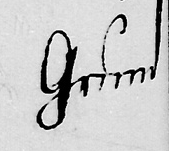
Person¬
